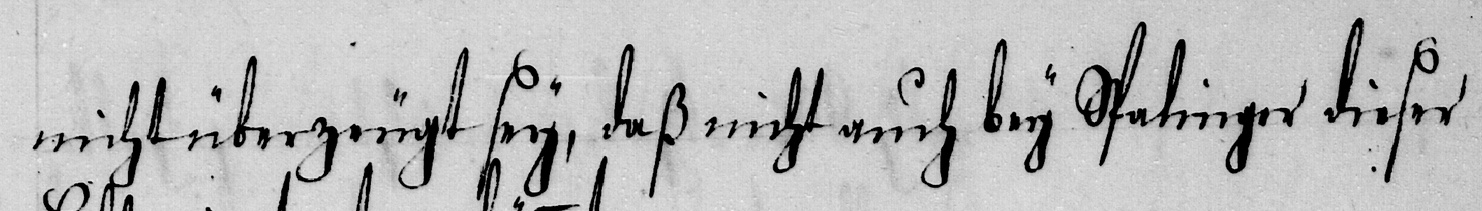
nicht überzeugt sey, daß nicht auch bey Spalinger dieser
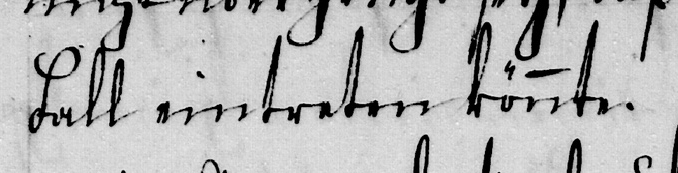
Fall eintreten könnte.
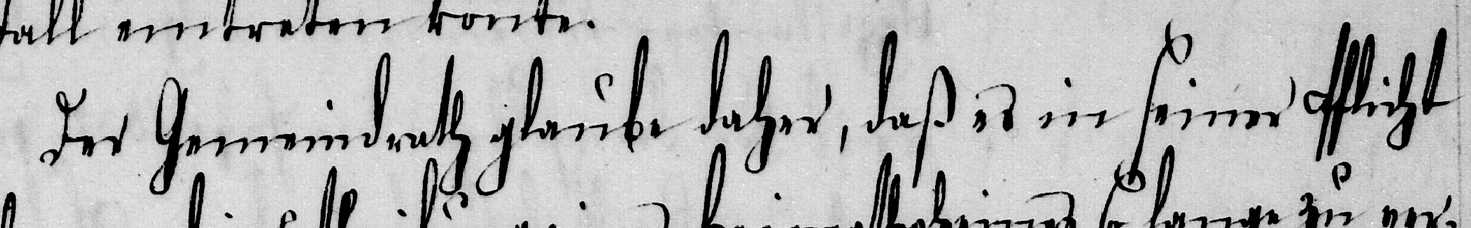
Der Gemeindrath glaube daher, daß es in seiner Pflic¬
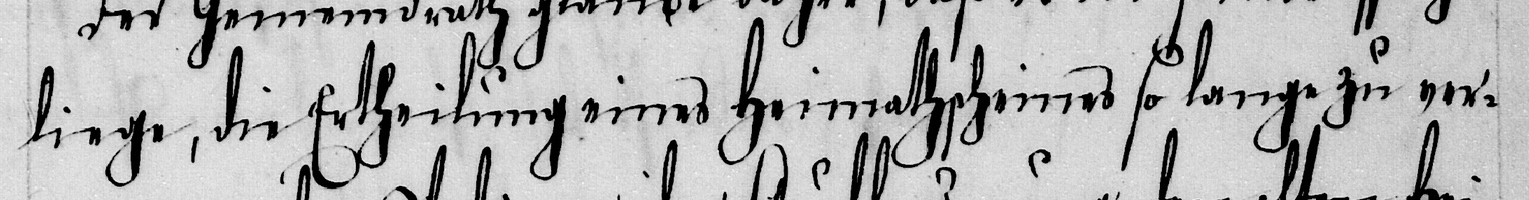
liege, die Ertheilung eines Heimathscheines so lange zu ver¬
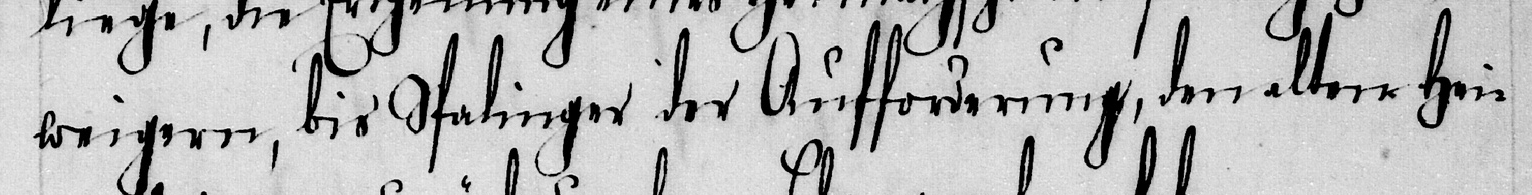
weigern, bis Spalinger der Aufforderung, den alten Hei¬
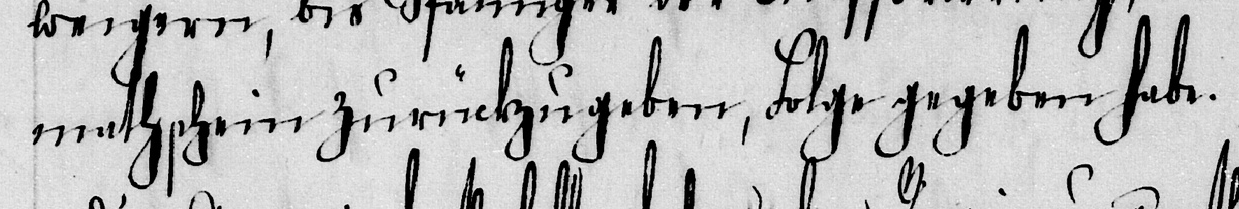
mathschein zurückzugeben, Folge gegeben habe.
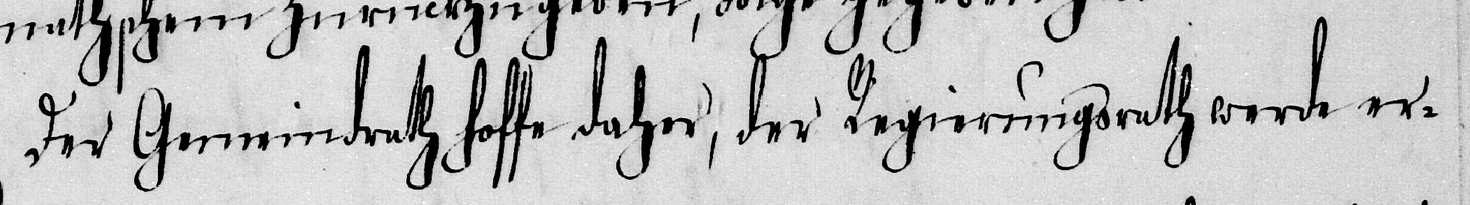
Der Gemeindrath hoffe daher, der Regierungsrath werde er¬
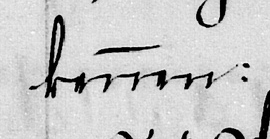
kennen:
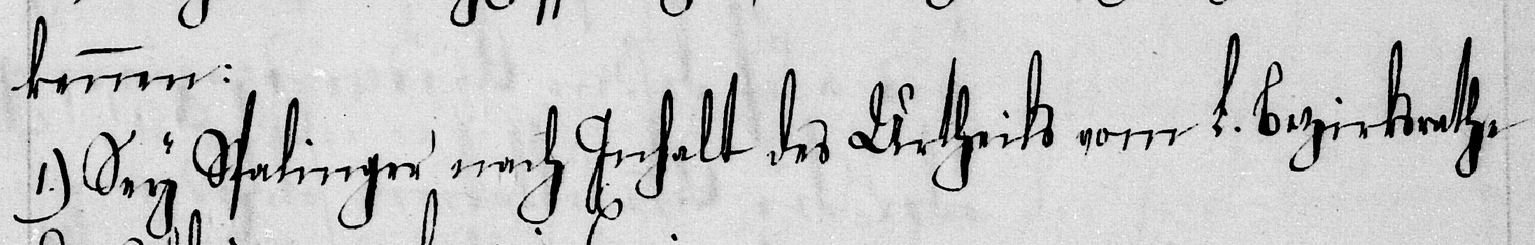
1.) Sey Spalinger nach Inhalt des Urtheils vom L. Bezirksrathe
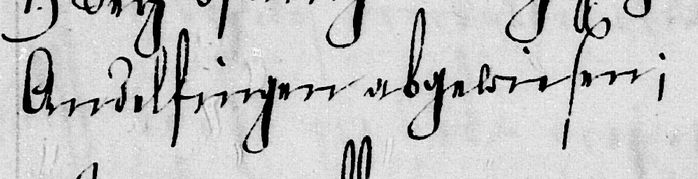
Andelfingen abgewiesen;
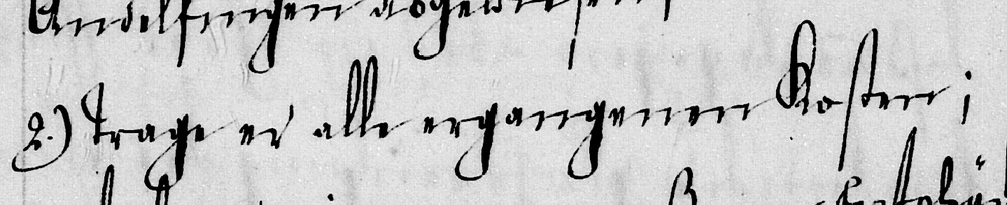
2.) Trage er alle ergangenen Kosten;
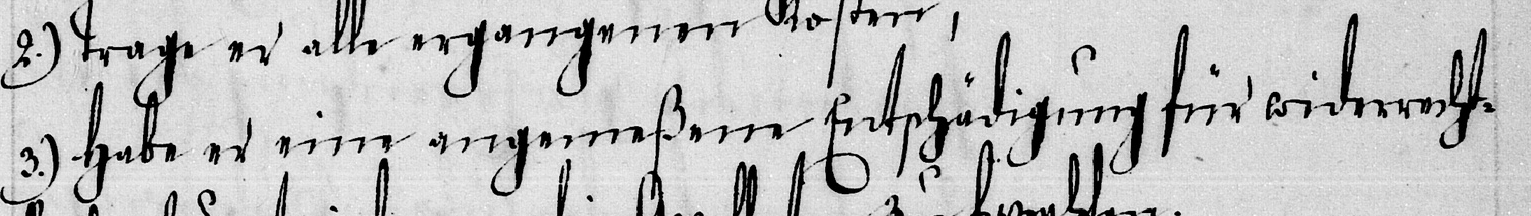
3.) Habe er eine angemeßene Entschädigung für widerrecht¬
